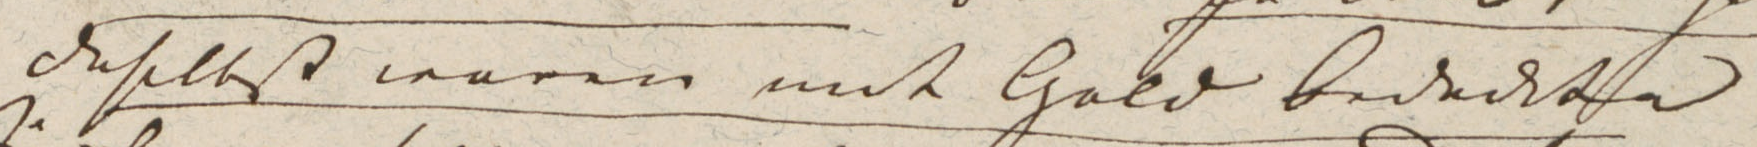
daselbst waren mit Gold bedeckte
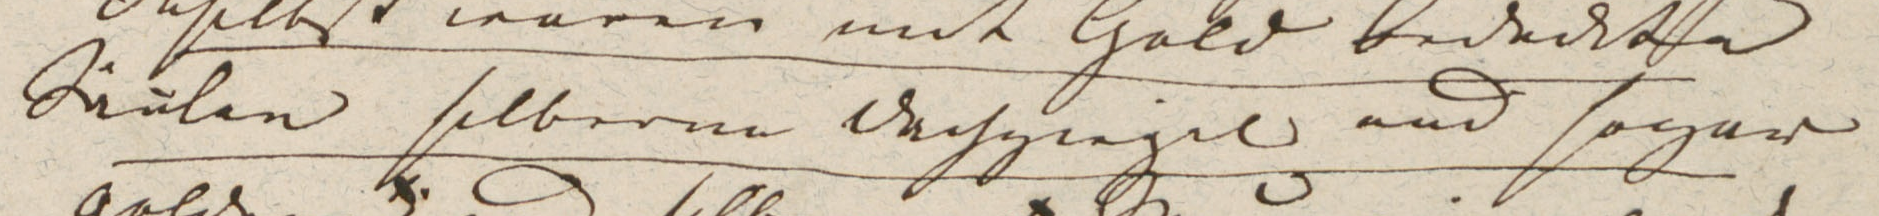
"Säulen silberne Dachziegel und sogar
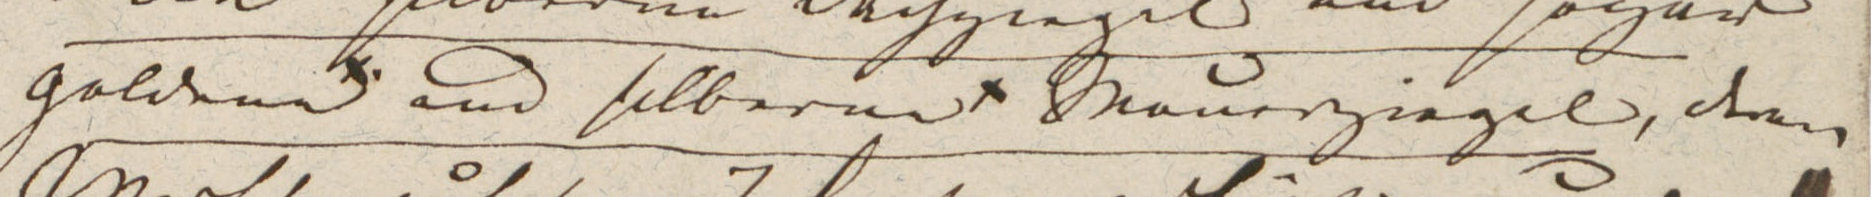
goldene % und silberne % Mauerziegel, deren
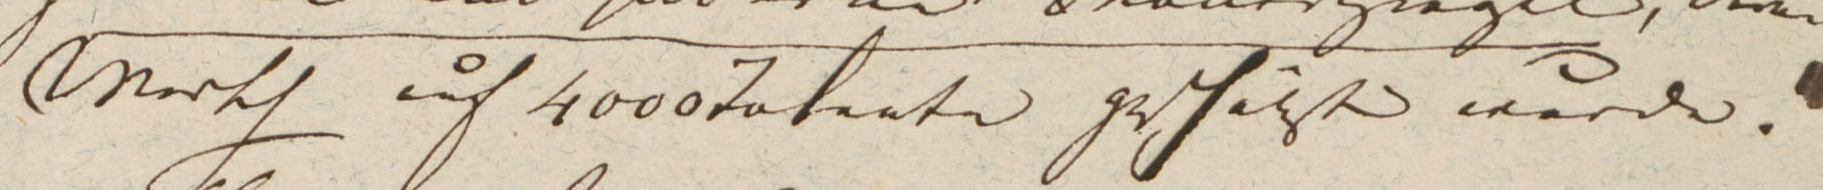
Werth auf 4000 Talente geschätzt wurde."
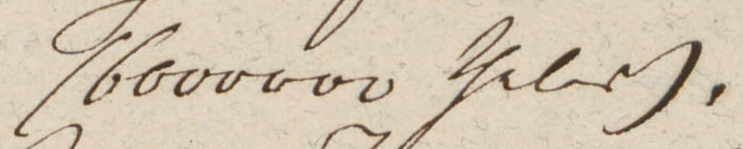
(6000000 Thaler).
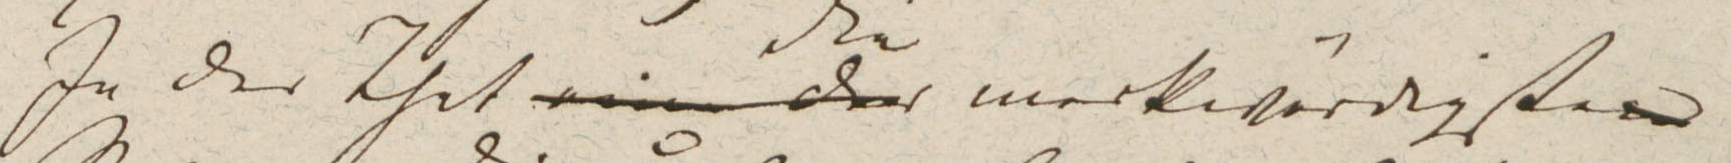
In der That eine der die merkwürdigsten
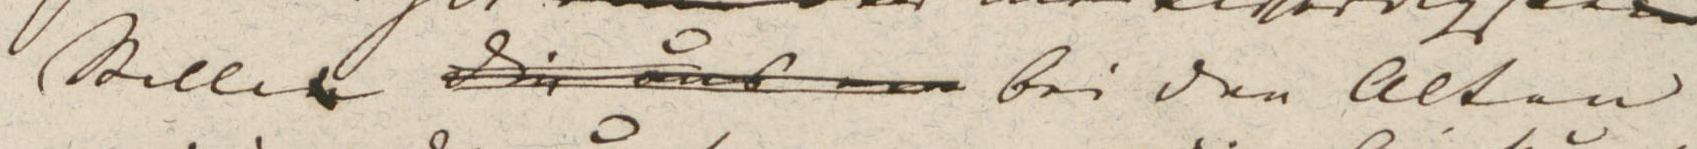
Stellen die aus von bei den Alten
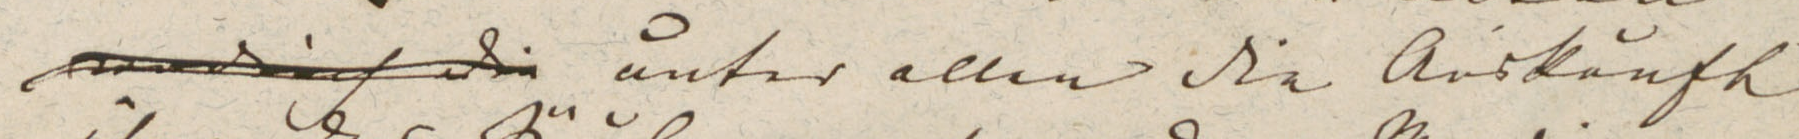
wodurch die unter allen die Auskunft
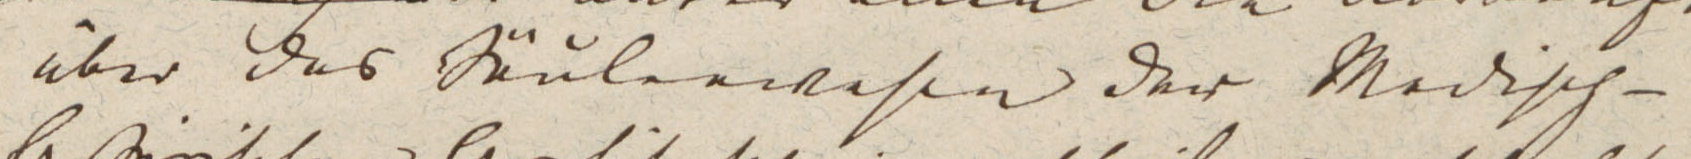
über das Säulenwesen der Medisch-
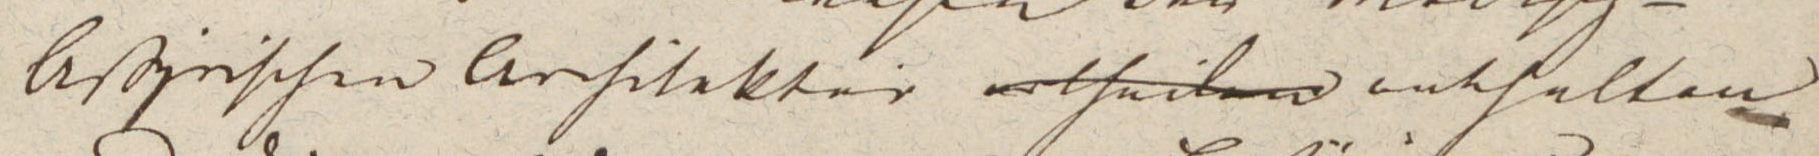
Assyrischen Architektur urtheilen enthalten
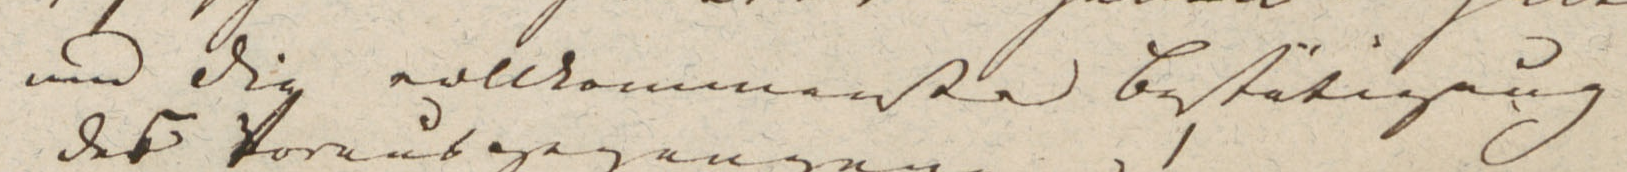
und die vollkommenste Bestätigung
